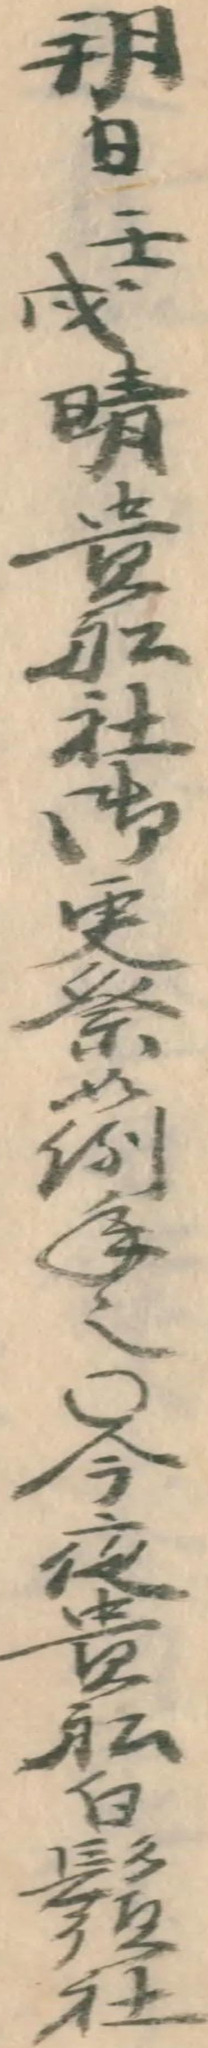朔日壬戌晴貴舩社御更祭如例年也○今夜貴舩白髭社
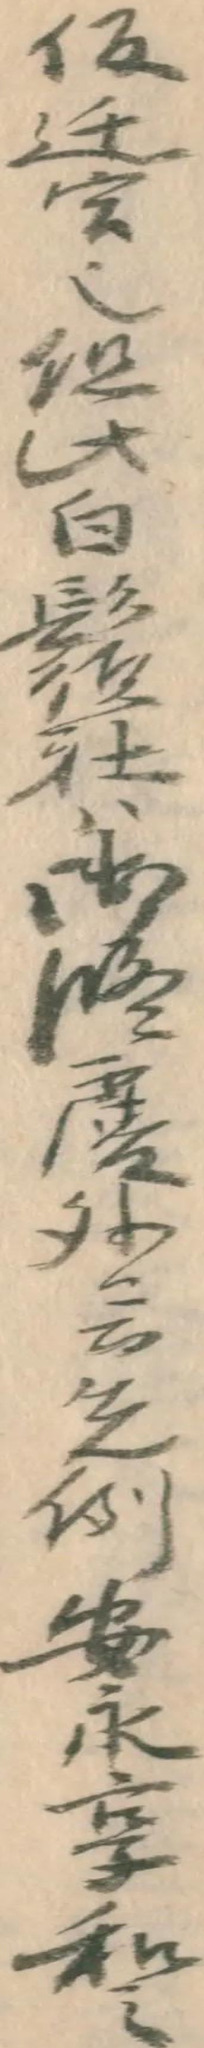仮遷宮也但此白髭社ハ御修覆外ニ而先例安永享和之
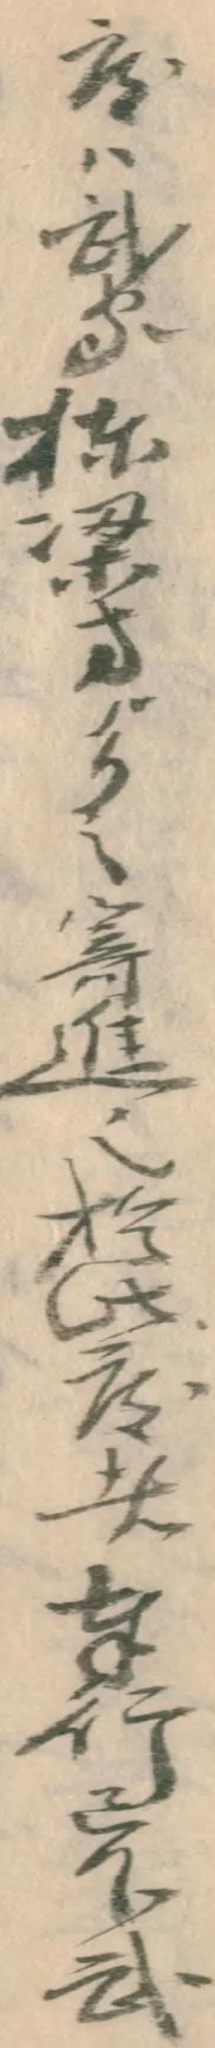度ハ武家棟梁方より之寄進也於此度者奉行已下武
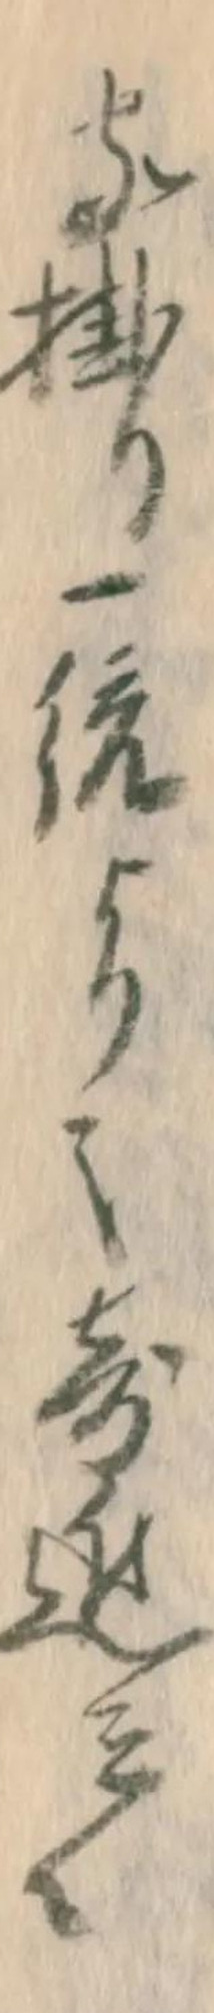家掛り一統より之寄進云々
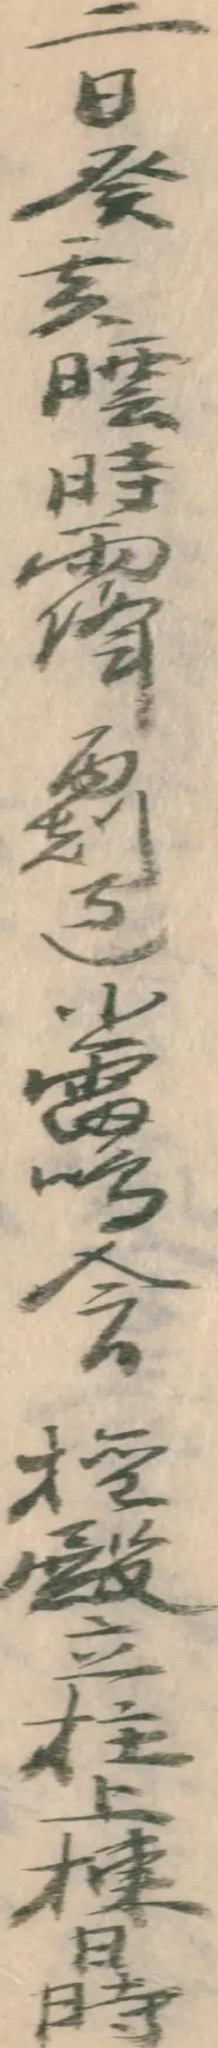二日癸亥曇時雨降酉刻過小雷鳴今日権殿立柱上棟日時
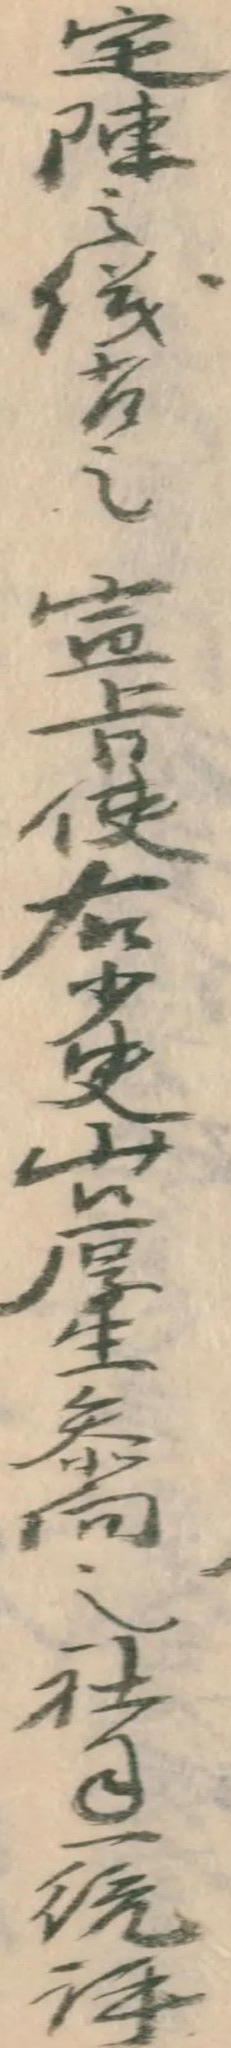定陣之儀有之宣旨使右少夫山口厚生参向也社司一統評
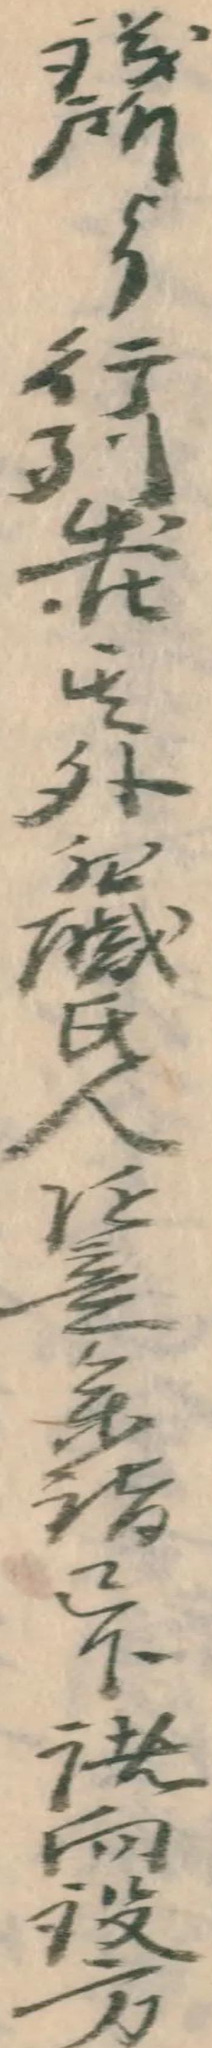議所より行列出仕其外宛職氏人随意参詣已下諸向役方
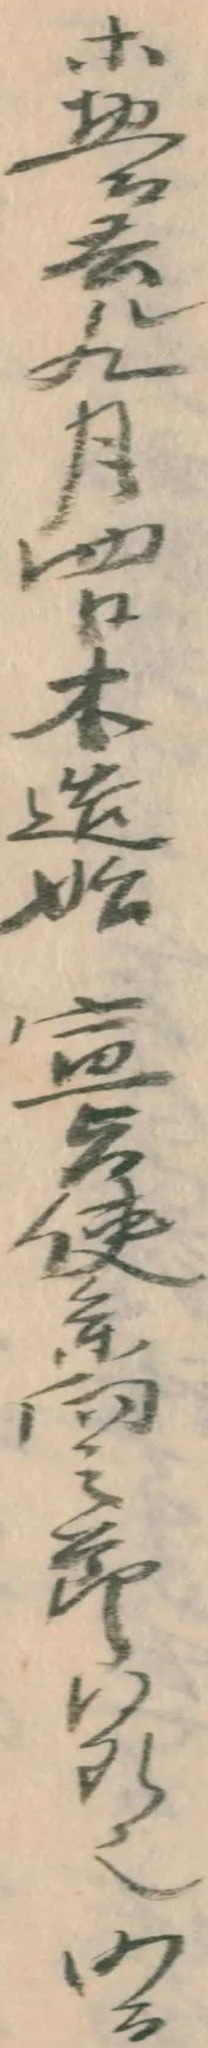等惣而去ル九月四日本造始宣旨使参向之節同断也仍而
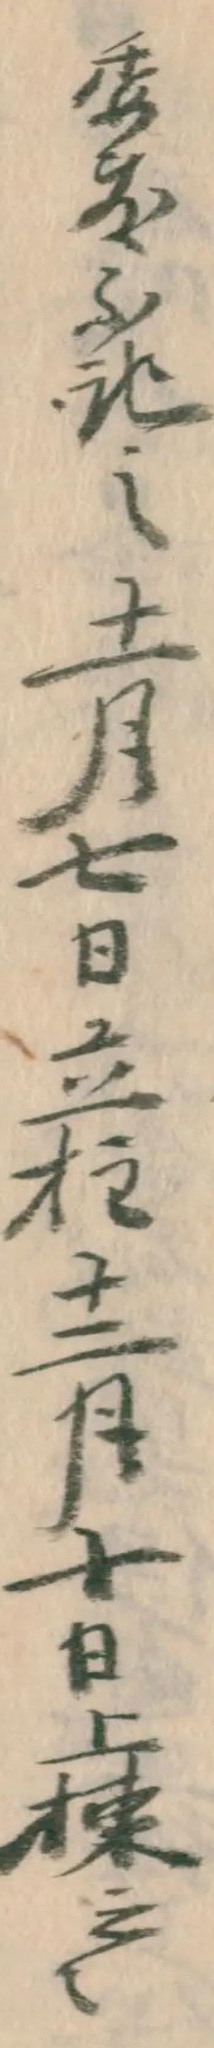委敷不記也十一月七日立柱十二月十日上棟云々
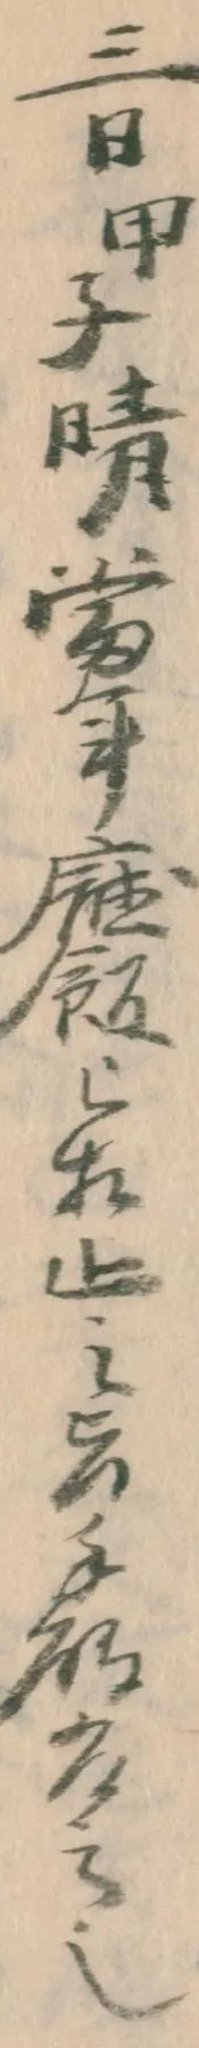三日甲子晴當年廰飯被相止之旨手觸有之也
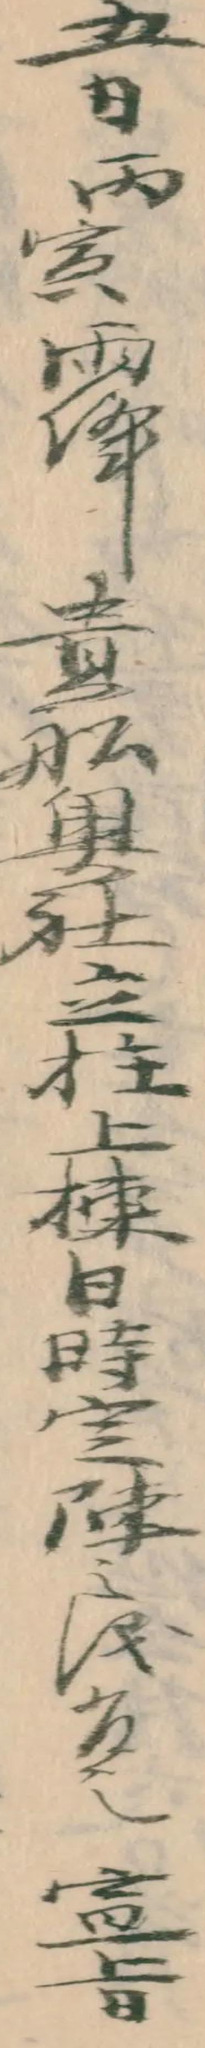五日丙寅雨降責舩奥社立柱上棟日時定陣之儀有之宣旨
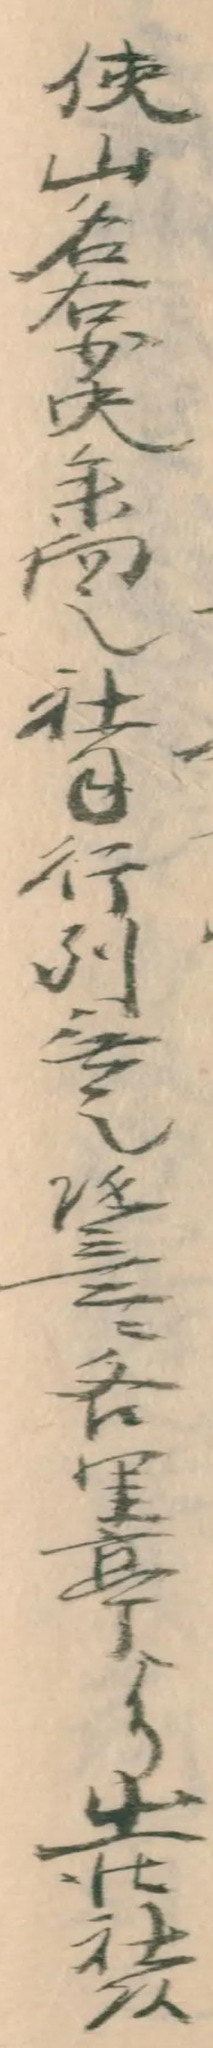使山名右少央参向也社司行列無之随意ニ各里亭より出仕社頭
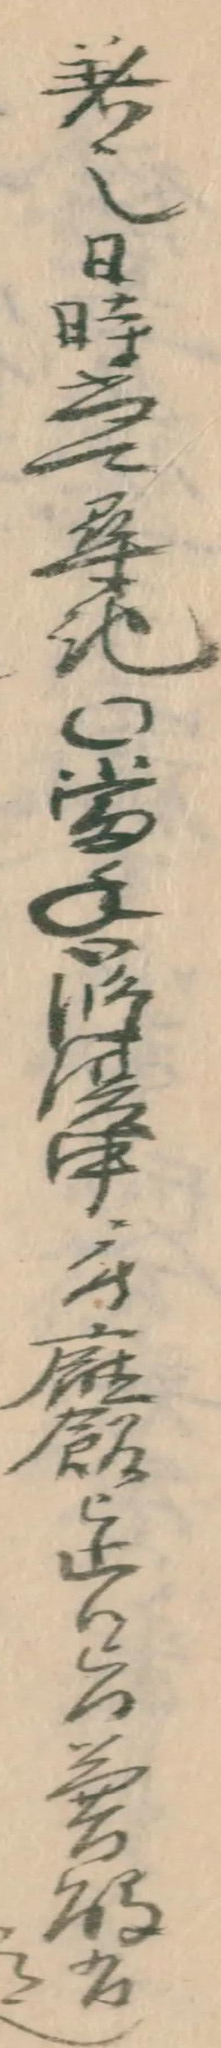着也日時尚可尋記○當年御修復中ニ付廰飯被止候旨兼而觸有之也
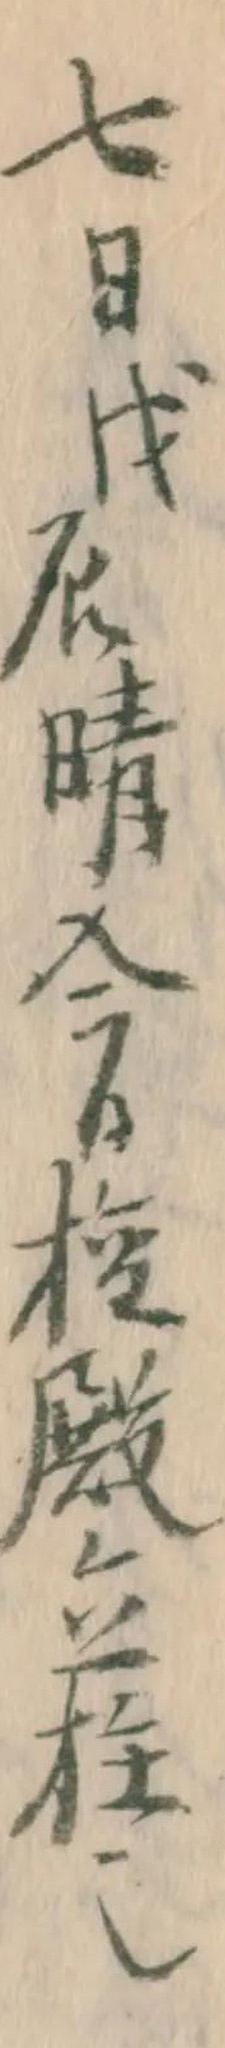七日戊辰晴今日権殿立柱也
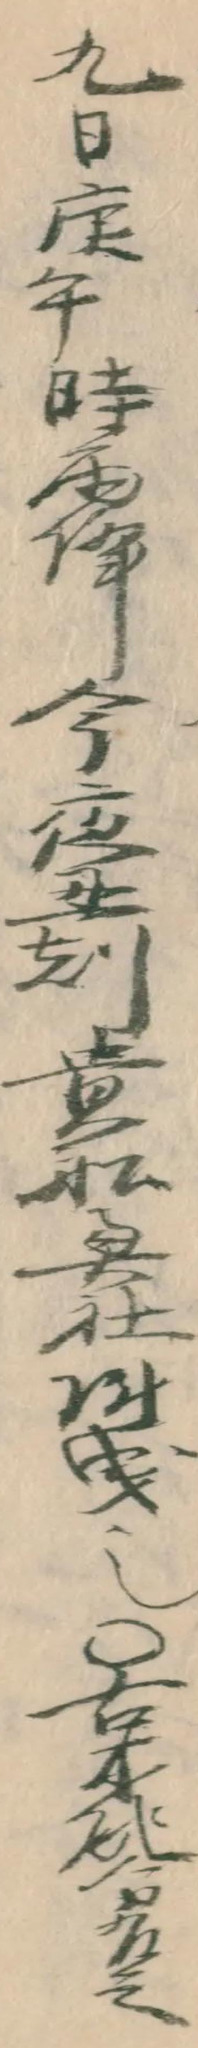九日庚午時雨降今夜丑刻貴舩奥社附曳也○古木配分有之
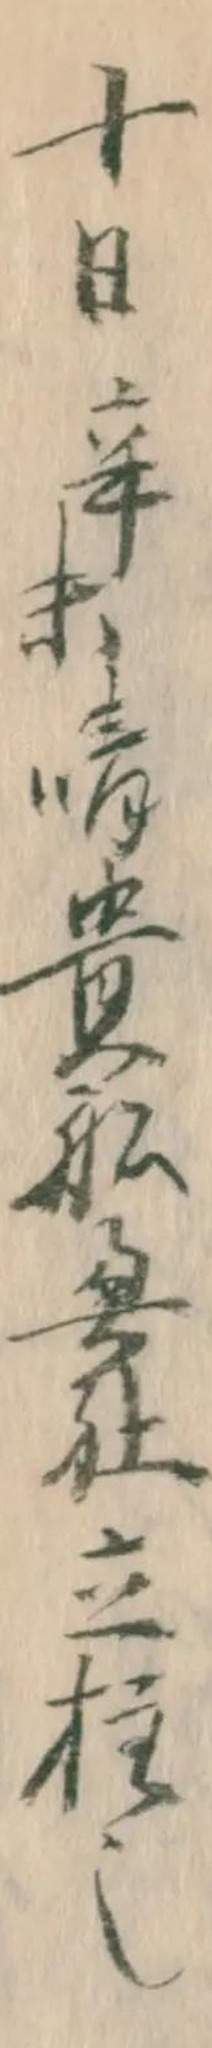十日辛未晴貴舩奥社立柱也
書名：賀茂社記録. 第66冊
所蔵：国立国会図書館 National Diet Library, JAPAN
